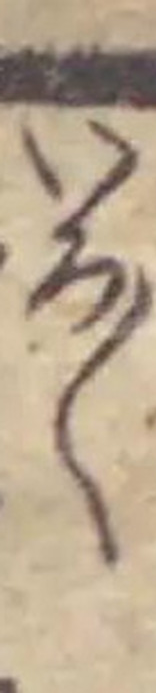いろ〳〵
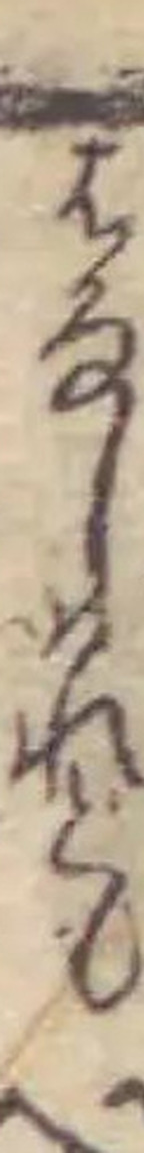はなしけれども
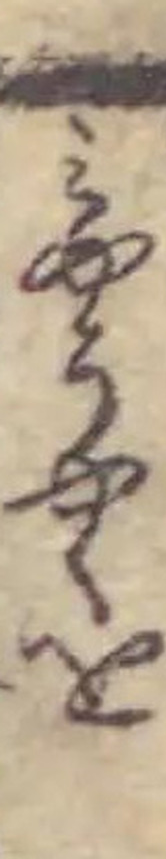みやうやくを
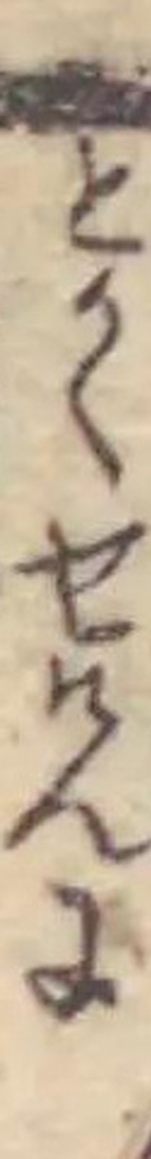とかくせけんに
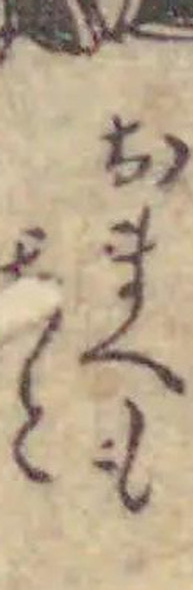おまへも
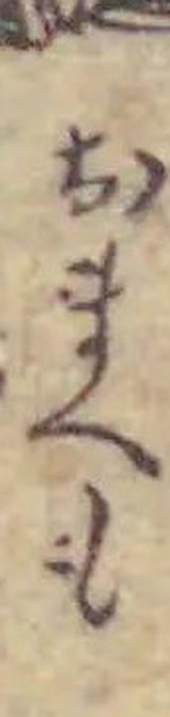おまへも
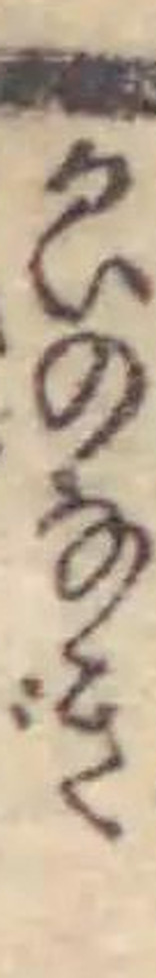かいのなき
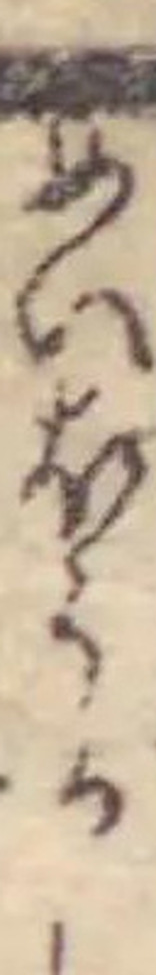めいほうが
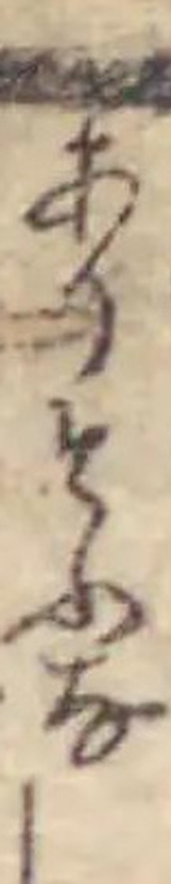ありそふな
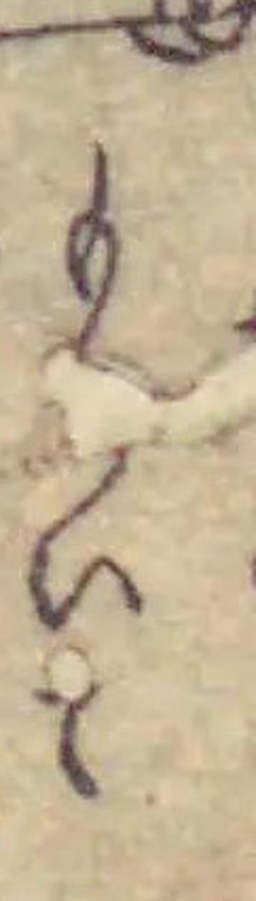もちいて
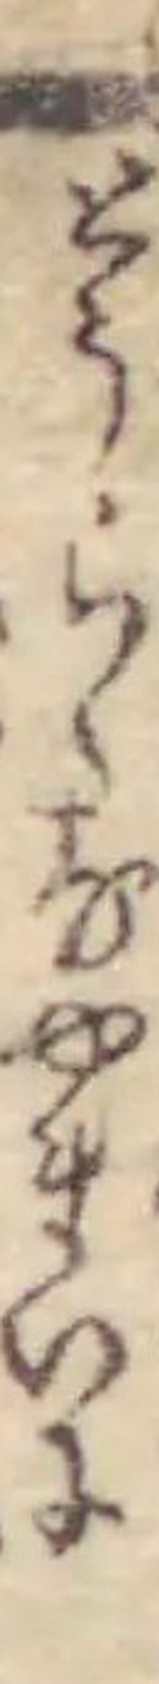とうらくなやまいに
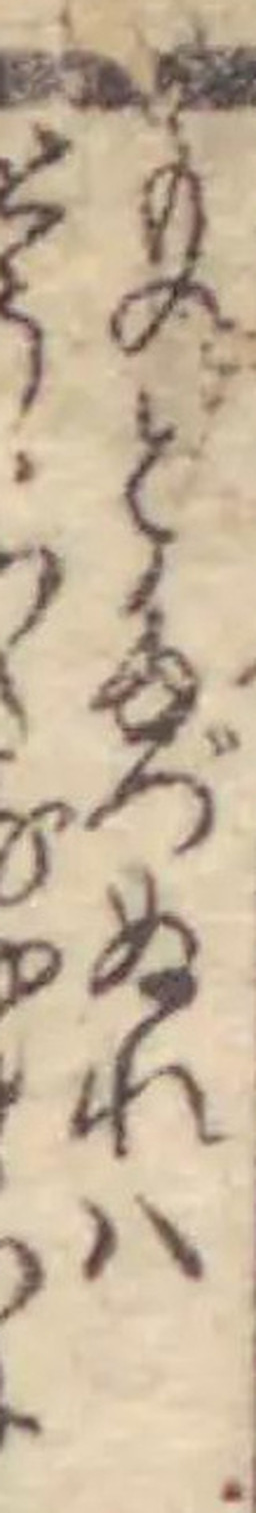とうらくなやまいに
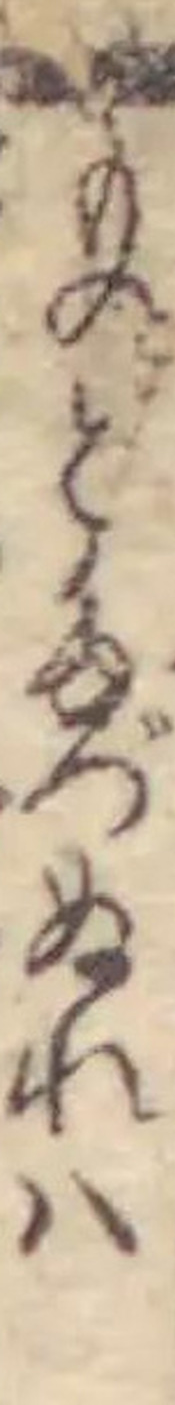ものとたづぬれは
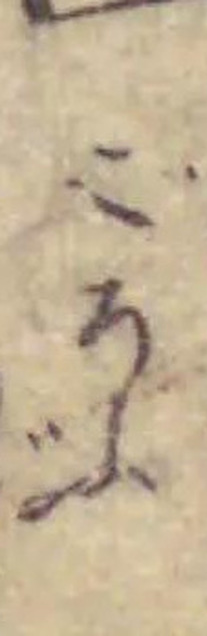ごろふ
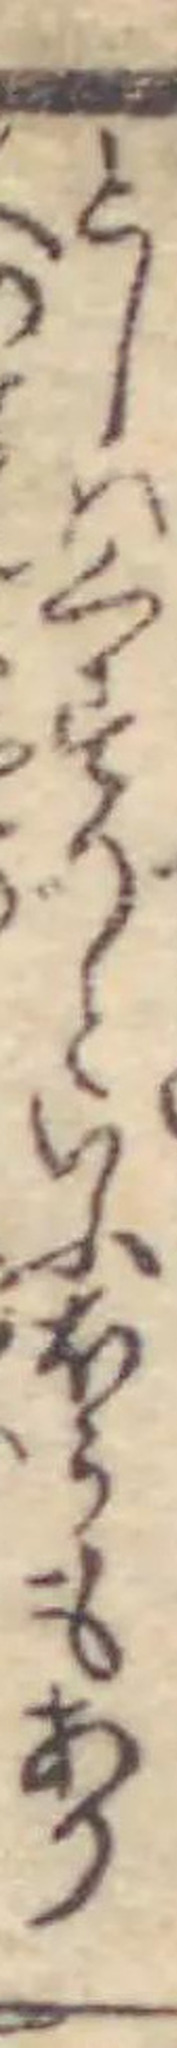としはくすりといふほうもあり
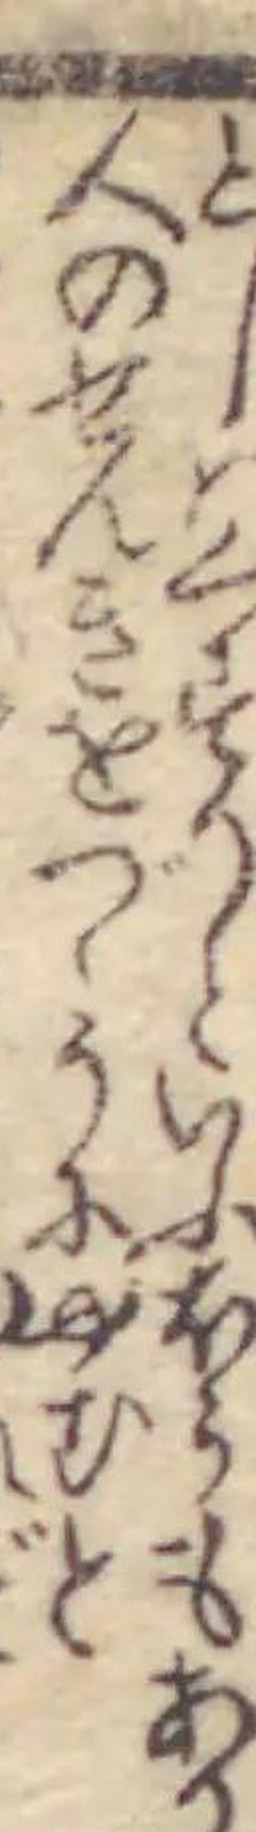人のせんきをづゝうにやむと
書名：家伝寿命薬 2巻
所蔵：国立国会図書館 National Diet Library, JAPAN
